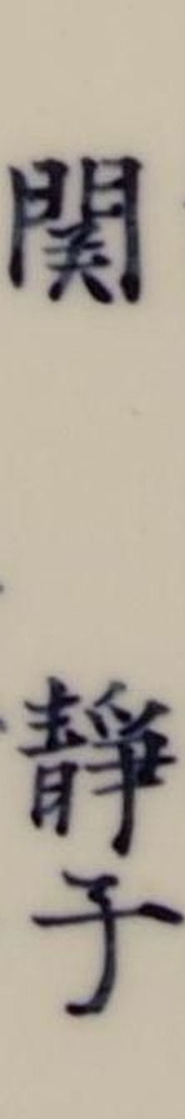関静子
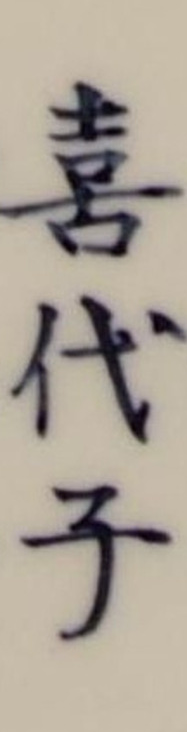喜代子
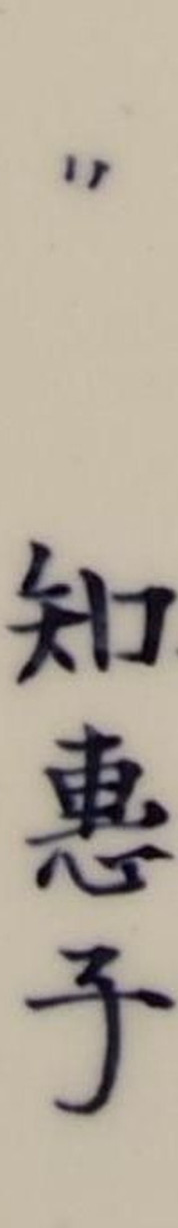知恵子
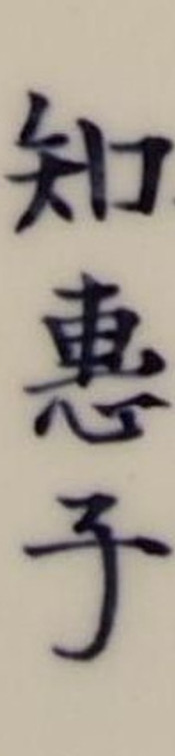知恵子
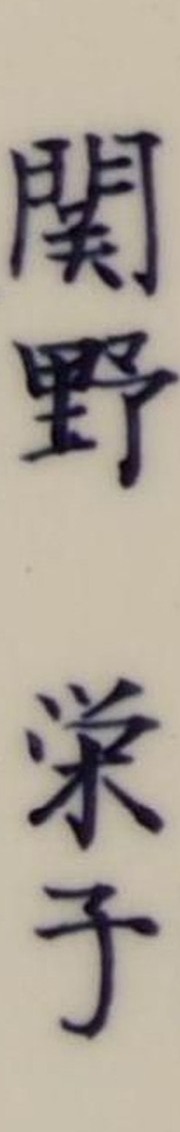関野栄子
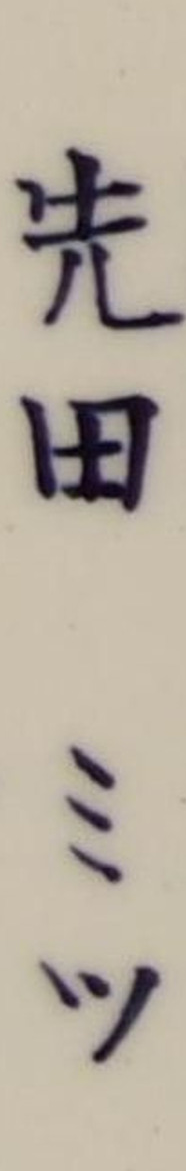先田ミツ

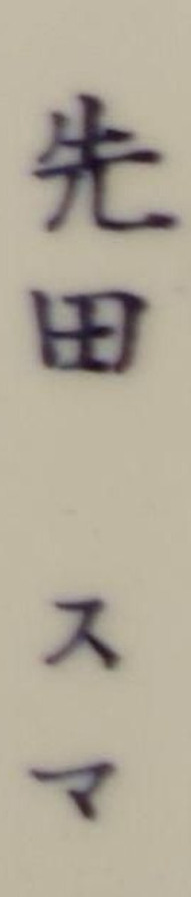先田スマ
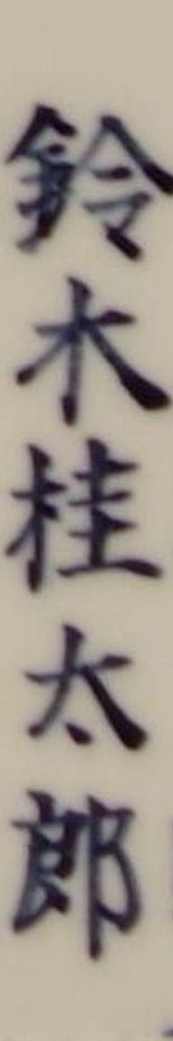鈴木桂太郎
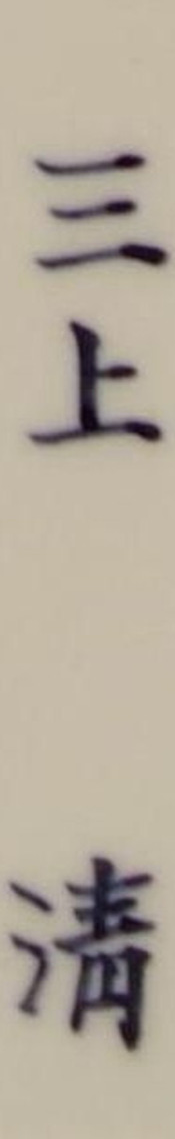三上清
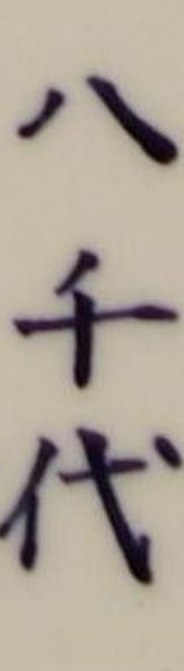八千代
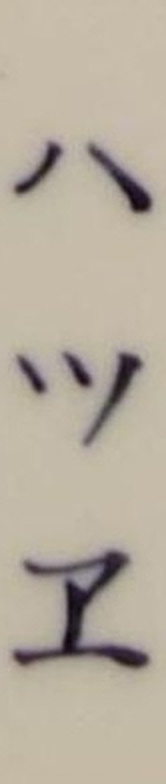ハツヱ
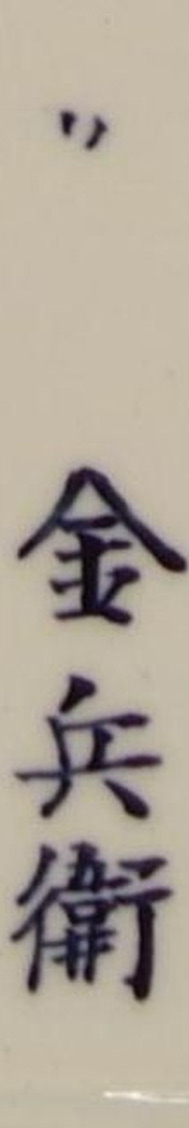金兵衛
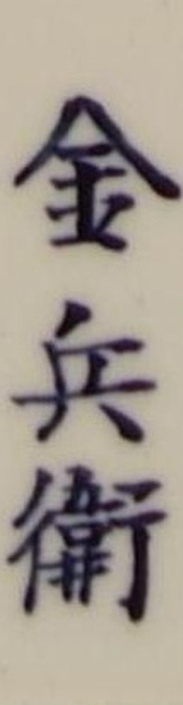金兵衛
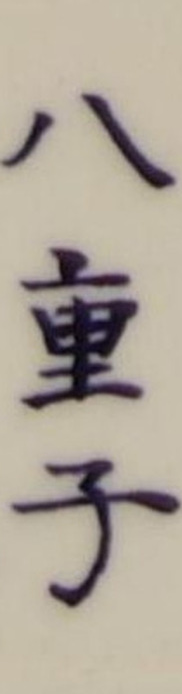八重子

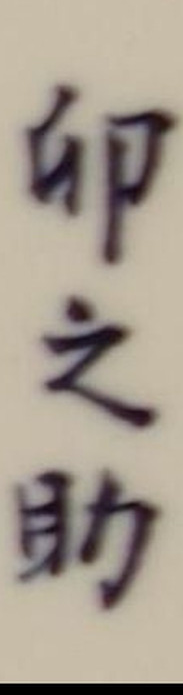卯之助
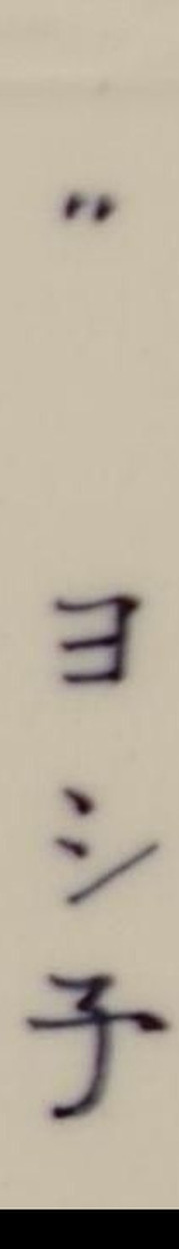ヨシ子
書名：M~S
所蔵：高野山金剛峯寺
